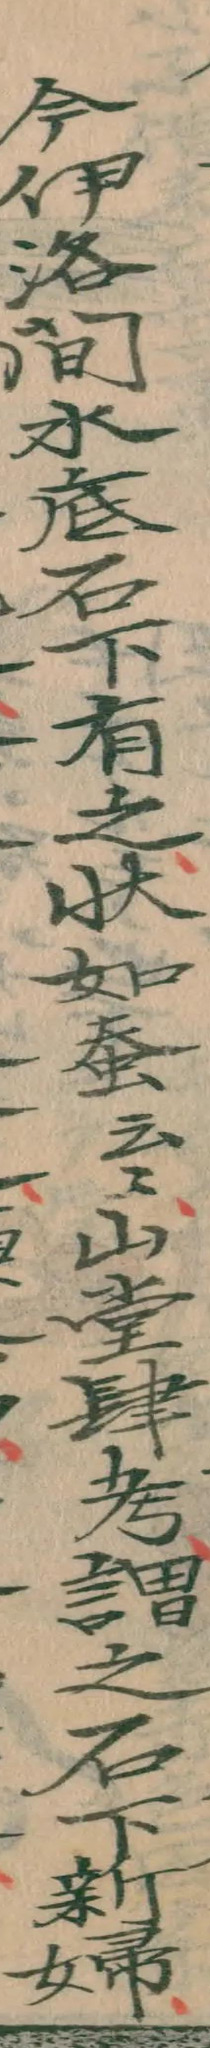今伊洛間水底石下有之、状如蚕云々、山堂肆考、謂之石下新婦、
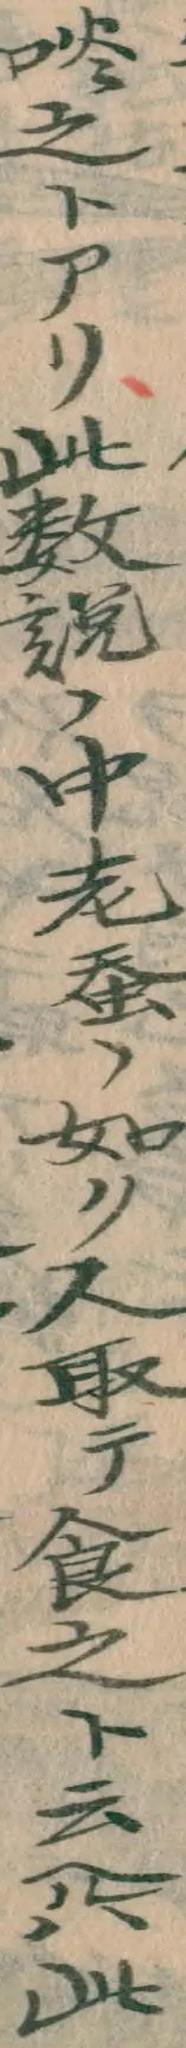啖之トアリ、此数説ノ中老蚕ノ如ク人取テ食之ト云ヘルハ此
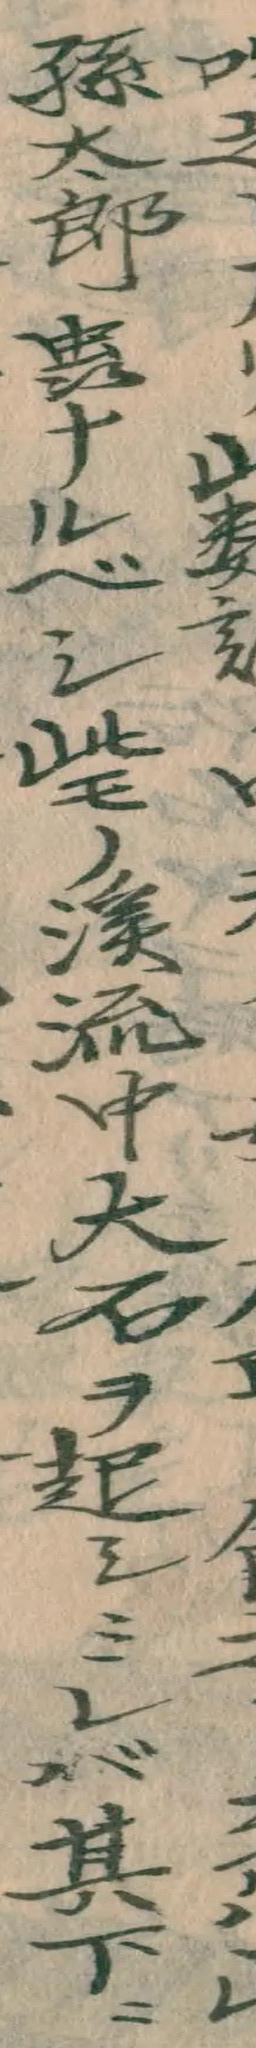孫太郎蟲ナルベシ此モノ渓流中大石ヲ起シミレバ其下ニ
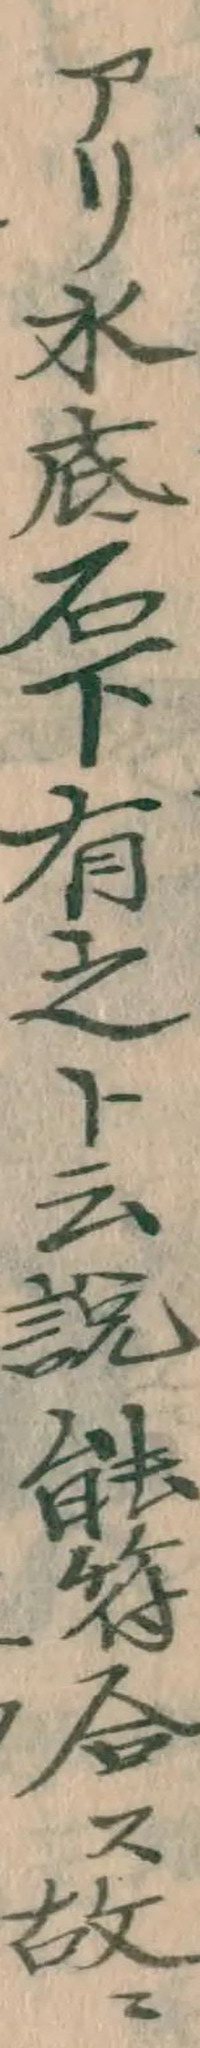アリ水底石下有之ト云説能符合ス故ニ
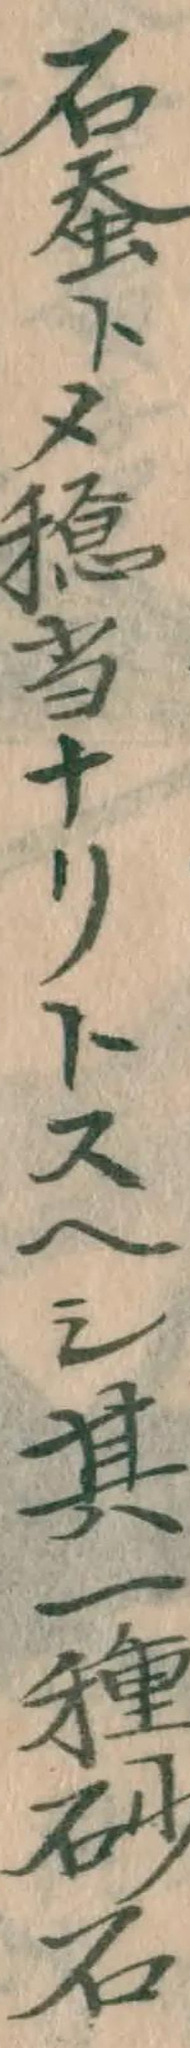石蚕トシテ穏当ナリトスヘシ其一種砂石
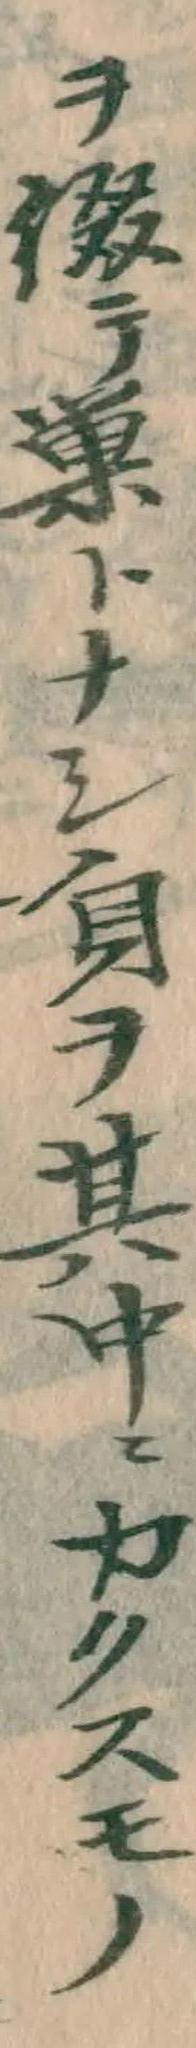ヲ綴テ巣トナシ身ヲ其中ニカクスモノ
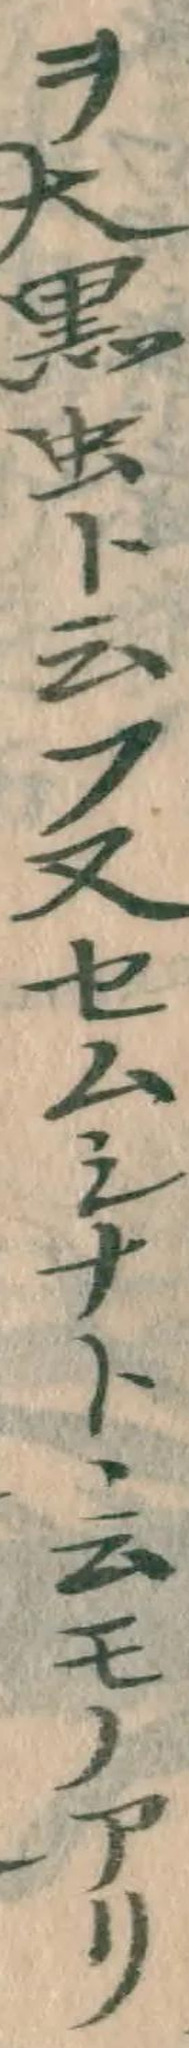ヲ大黒虫ト云フ又セムシナトヽ云モノアリ
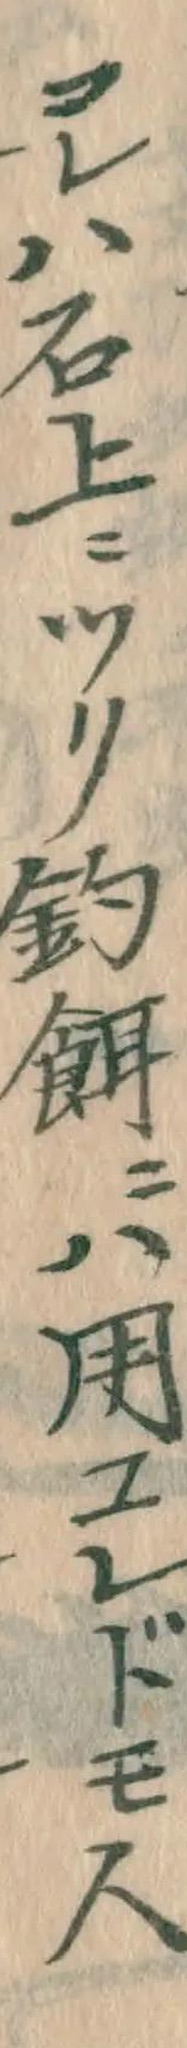コレハ石上ニツク釣餌ニハ用ユレドモ人
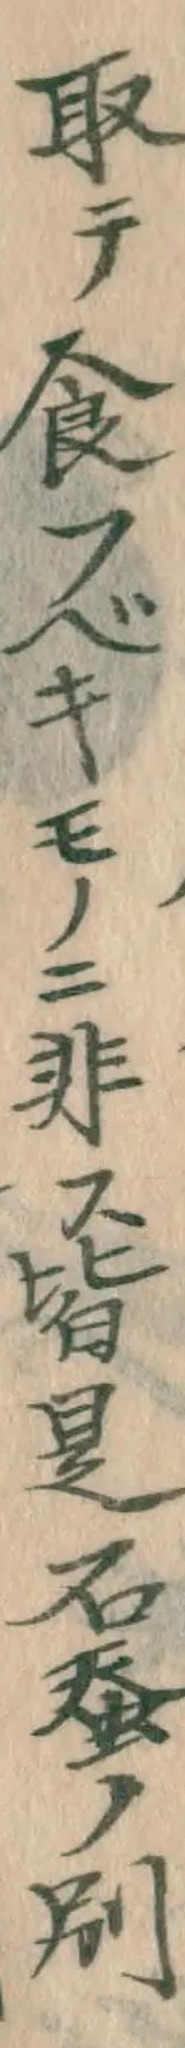取テ食フベキモノニ非ス皆是石蚕ノ別
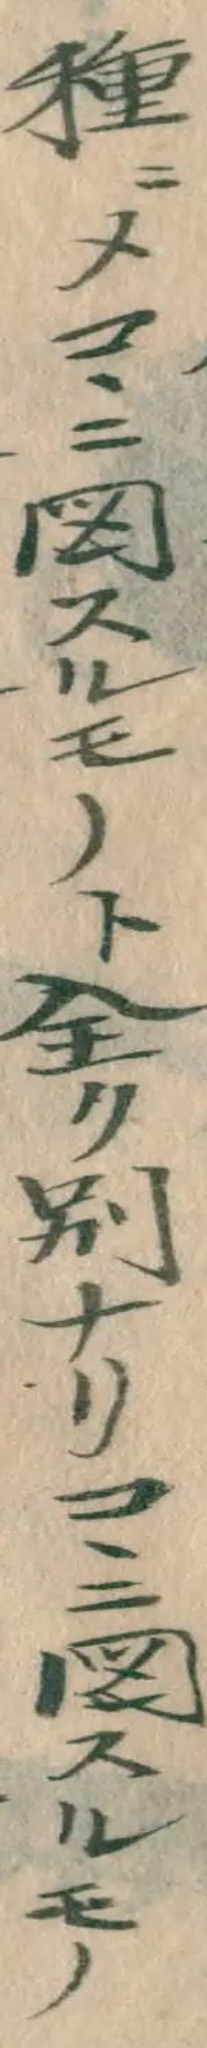種ニシテコヽニ図スルモノト全ク別ナリコヽニ図スルモノ
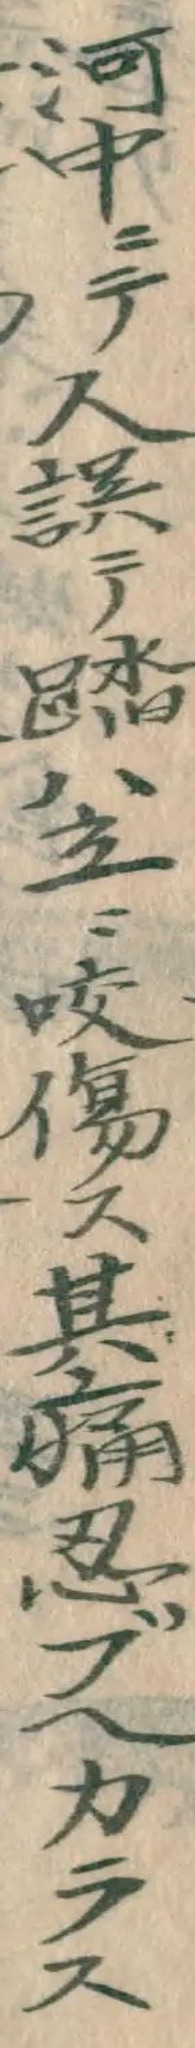河中ニテ人誤テ踏ハ立ニ咬傷ス其痛忍ブヘカラス
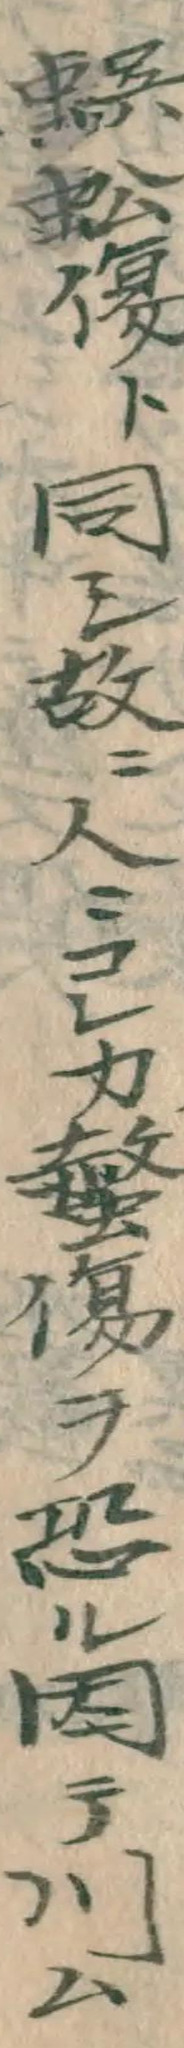蜈蚣傷ト同シ故ニ人々コレカ螫傷ヲ恐ル因テ川ム
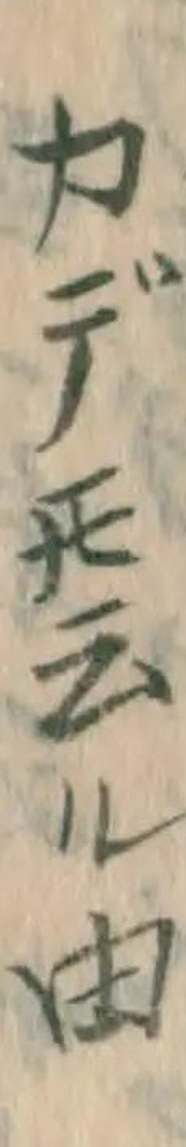カデトモ云ル由

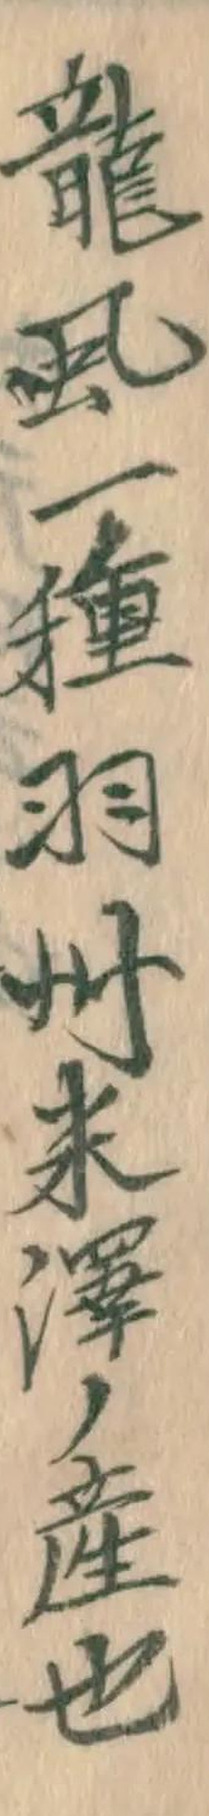龍虱一種羽州米澤ノ産也
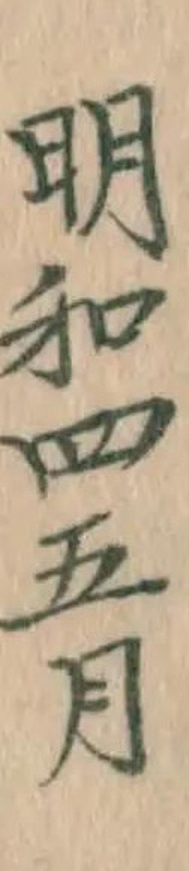明和四五月
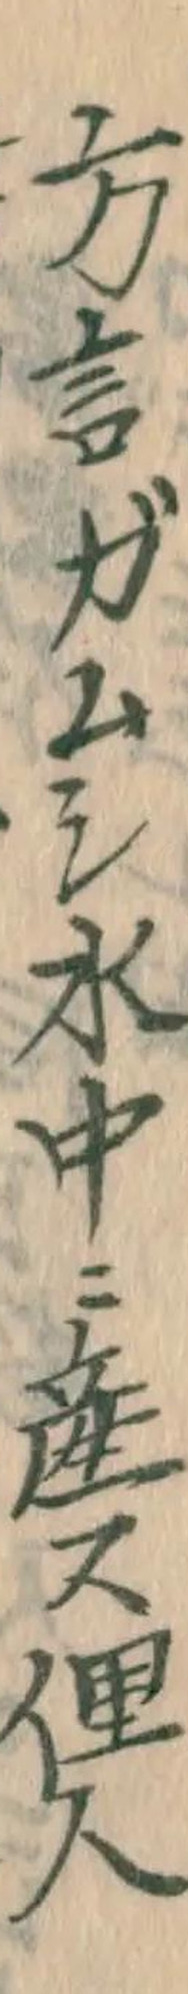方言ガムシ水中ニ産ス俚人
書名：千蟲譜 3巻. [1]
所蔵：国立国会図書館 National Diet Library, JAPAN
